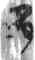垑
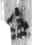於
